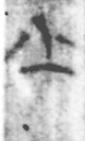少
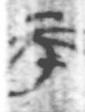帀（師）
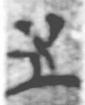之
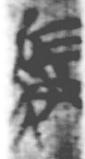駟
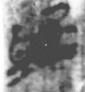○（右）
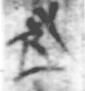驂
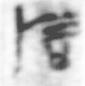石
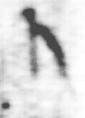人
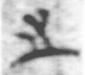之
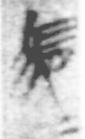駟
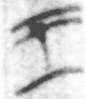王
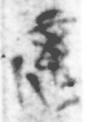僮
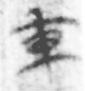車
